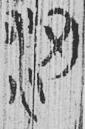{水刅}（梁）
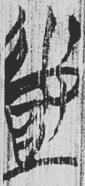○（愷）
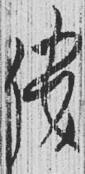俤
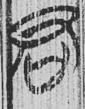君
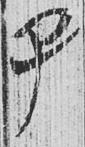子
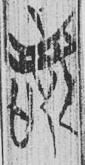若
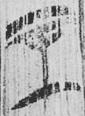玉
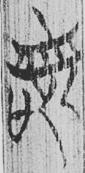若
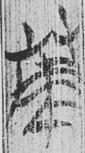英
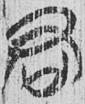君
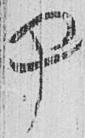子
